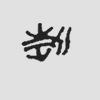折
